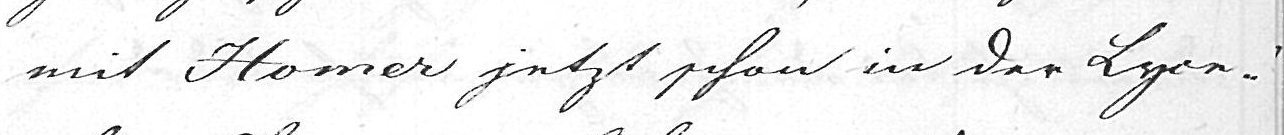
mit Homer jetzt schon in Lyce-
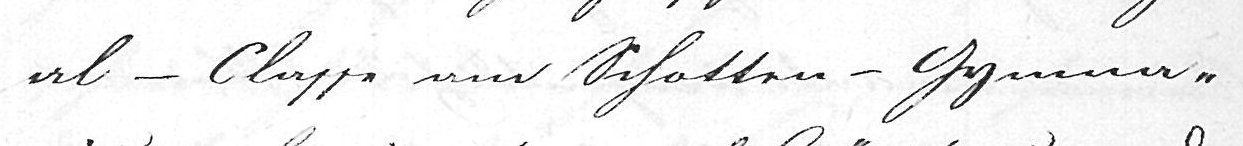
al-Classe am Schotten-Gymna-
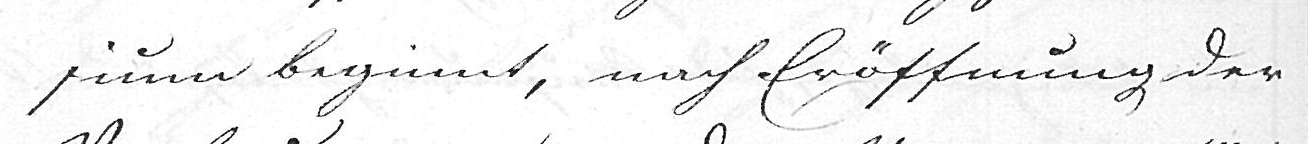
sium beginnt, nach Eröffnung der
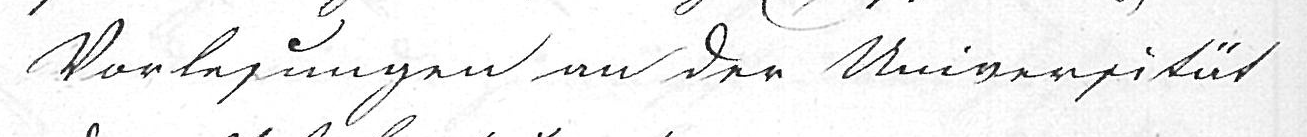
Vorlesungen an der Universität
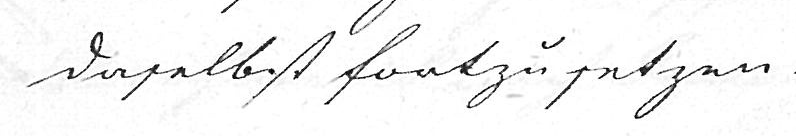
daselbst fortzusetzen.
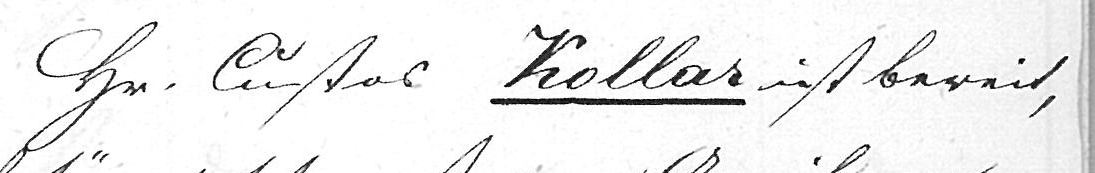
Hr. Custoa Kollar ist bereit,
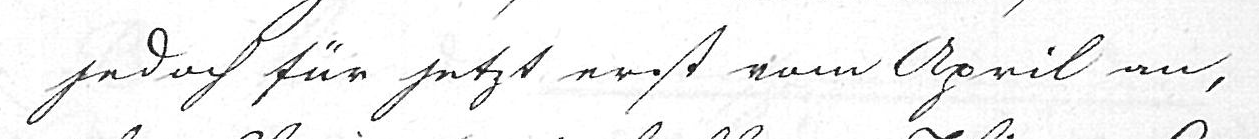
jedoch für jetzt erst vom April an,
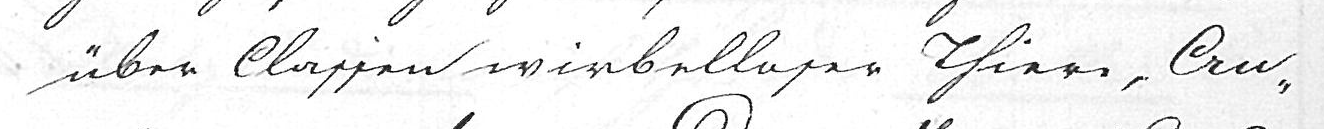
über Classen wirbelloser Thiere, Cru-
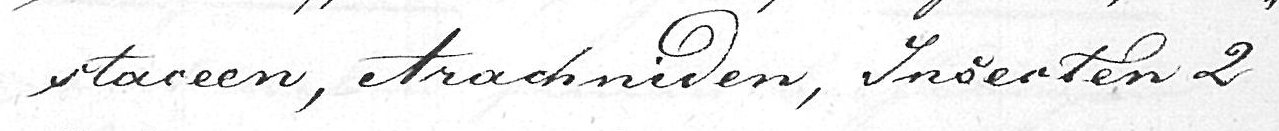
staceen, Arachniden, Insecten 2
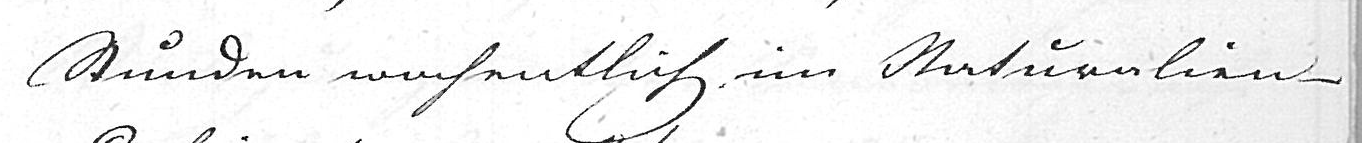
Stunden wochentlich im Naturalien-
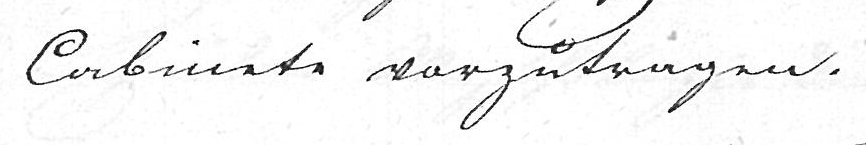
Cabinete vorzutragen.
